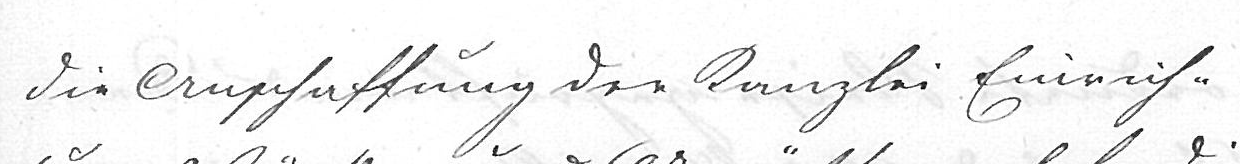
die Anschaffung der Kanzlei Einrich-
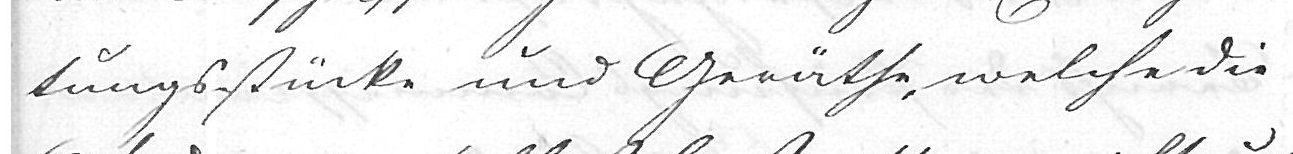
tungsstücke und Geräthe, welche die
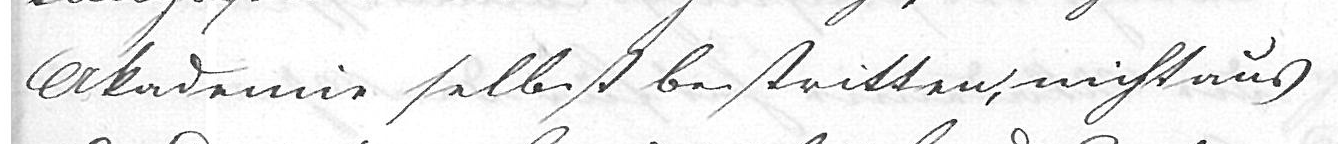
Akademie selbst bestreitten, nicht aus
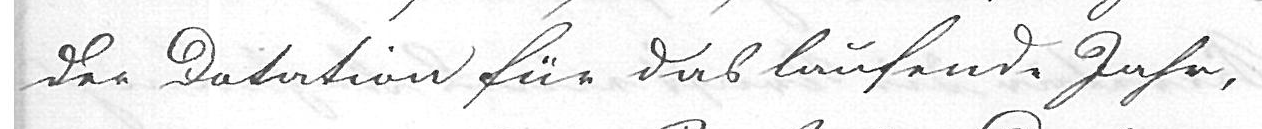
der Dotation für das laufende Jahre,
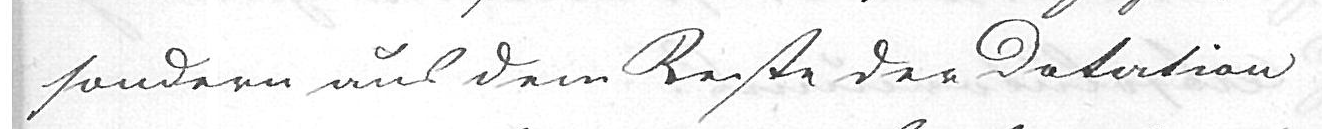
sondern aus dem Reste der Dotation
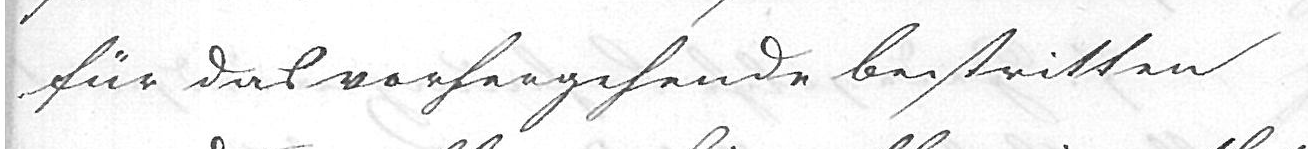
für das vorhergehende bestritten
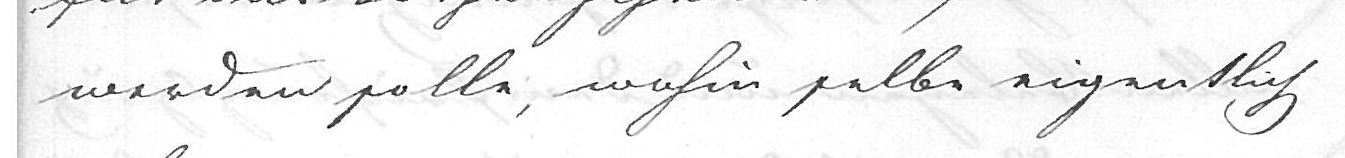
werden solle, wohin selbe eigentlich
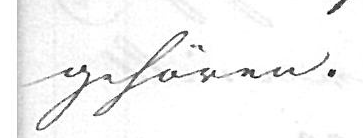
gehören.
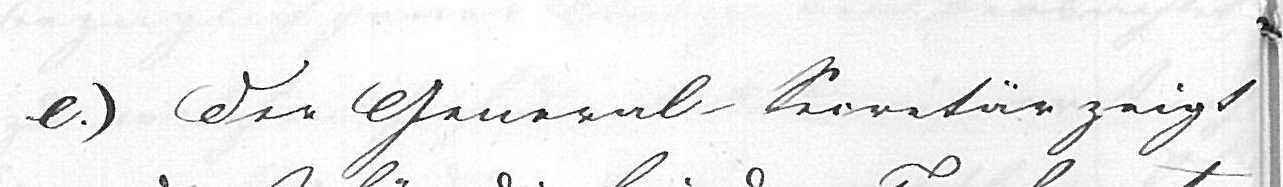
e) Der General-Secretär zeigt
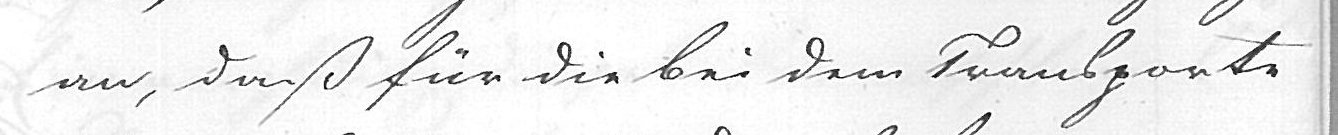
an, daß für die bei dem Transporte
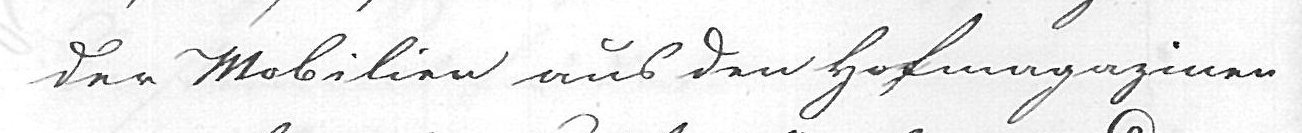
der Mobilien aus den Hofmagazinen
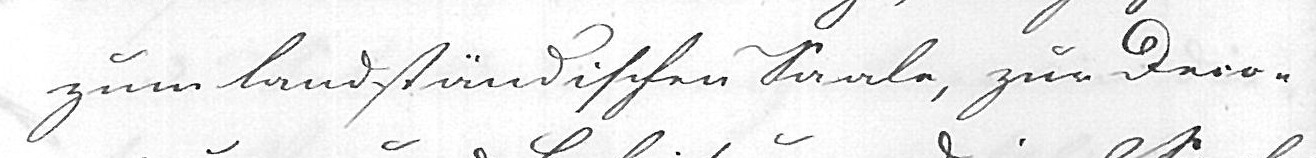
zum landständischen Saale, zur Deco-
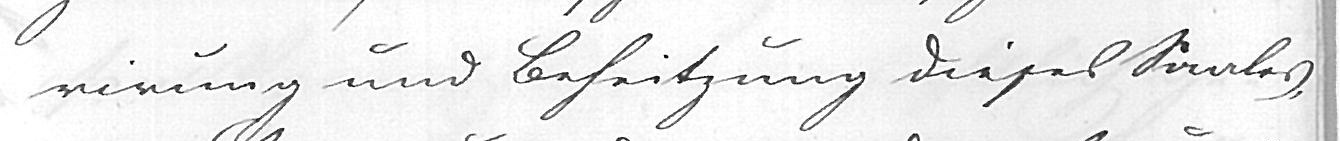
rirung und Beheitzung dieses Saales
